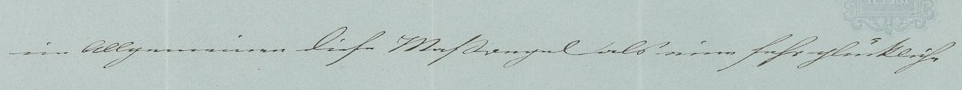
im Allgemeinen diese Maßregel als eine sehr glückliche
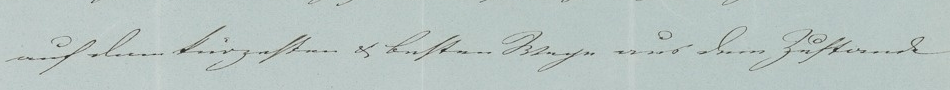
auf dem kürzesten & besten Wege aus dem Zustande
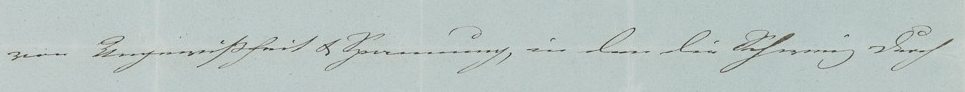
von Ungewißheit & Spannung, in den die Schweiz durch
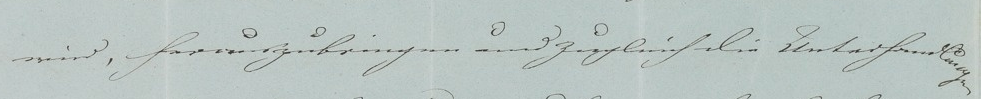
wird, herauszubringen und zugleich die Unterhandlungen
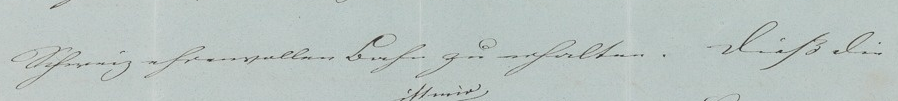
Schweiz ehrenvollen Bahn zu erhalten. Dieß die
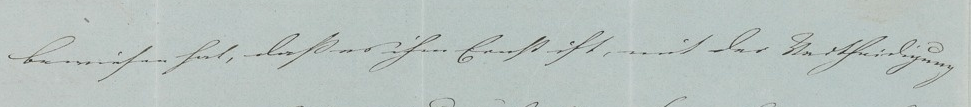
bewiesen hat, daß es ihm Ernst ist, mit der Vertheidigung
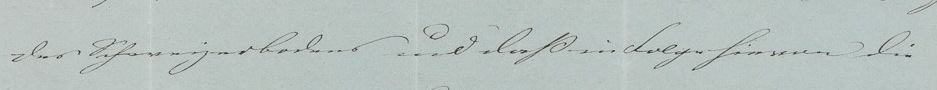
des Schweizerbodens und daß in Folge hievon die
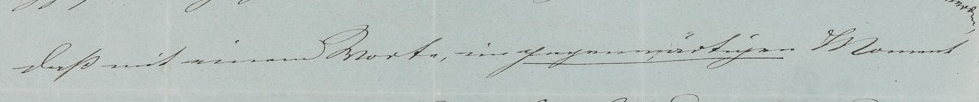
daß mit einem Worte, im gegenwärtigen Moment
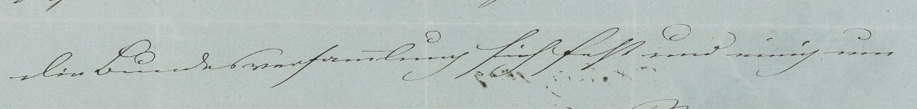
die Bundesversammlung sich fest und einig um
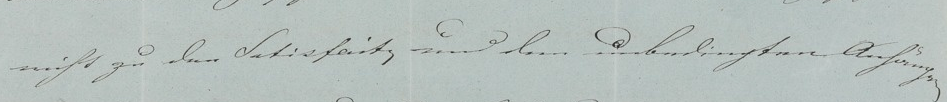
nicht zu den Satisfaits und den unbedingten Anhängern
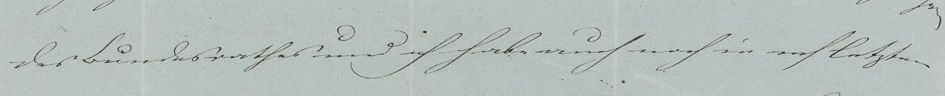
des Bundesrathes und ich habe auch noch in meinem letzten
